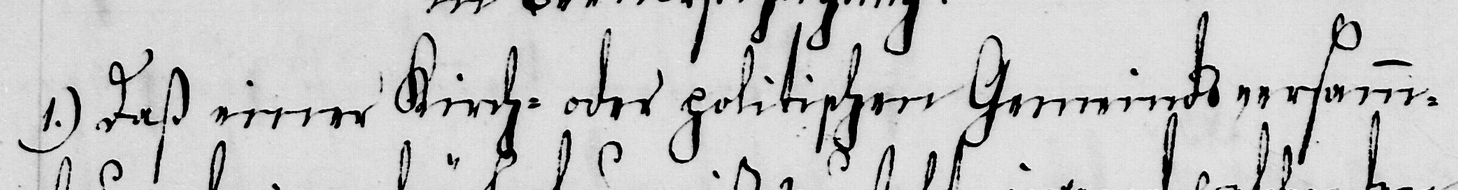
1.) Daß einer Kirch- oder politischen Gemeindsversamm¬
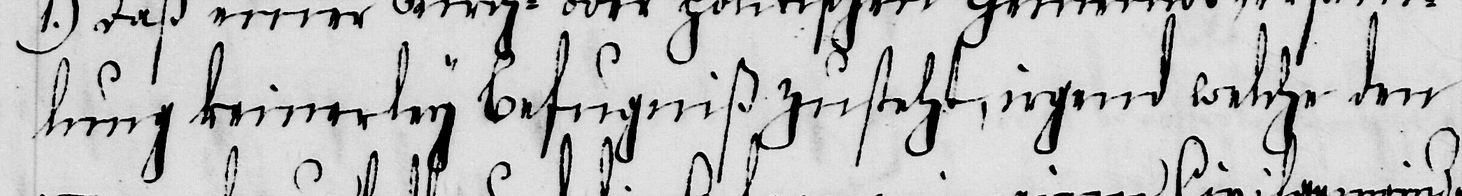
lung keinerley Befugniß zusteht, irgend welche den
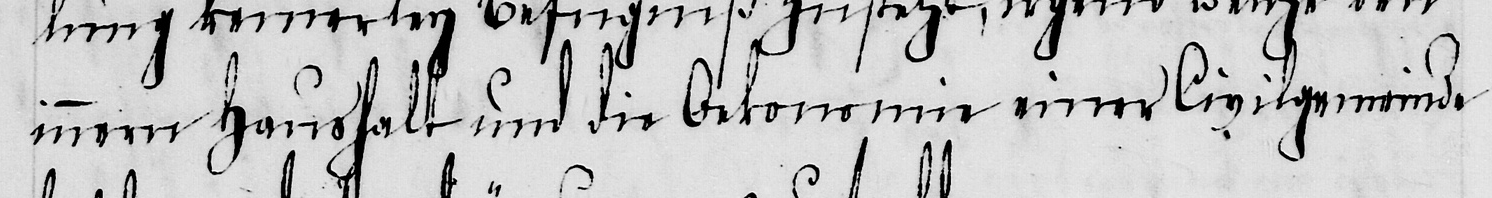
innern Haushalt und die Oekonomie einer Civilgemeinde
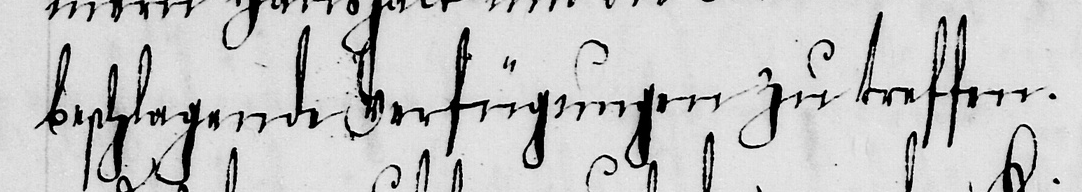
beschlagende Verfügung zu treffen.
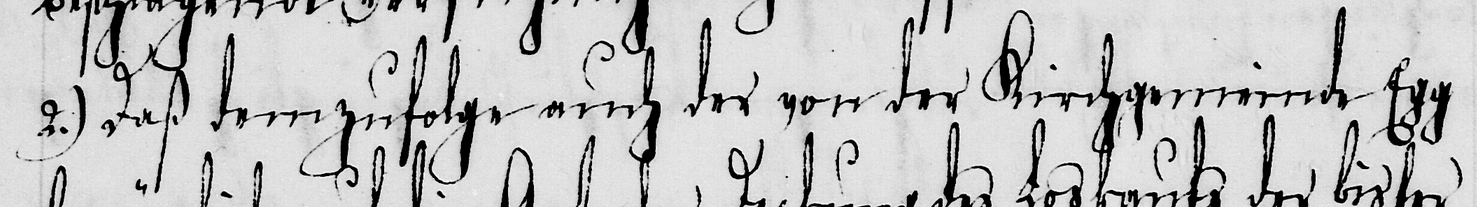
2.) Daß demzufolge auch der von der Kirchgemeinde Egg
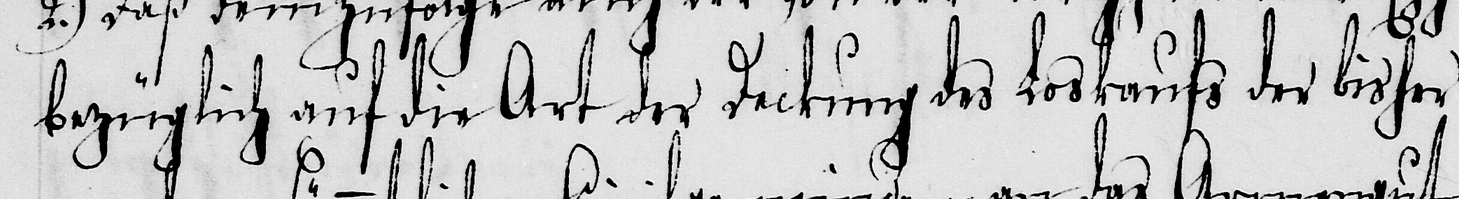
bezüglich auf die Art der Deckung des Loskaufs der bisher
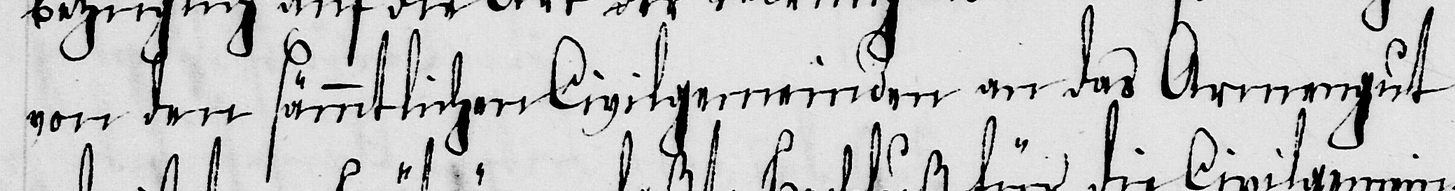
von den sämmtlichen Civilgemeinden an das Armengut
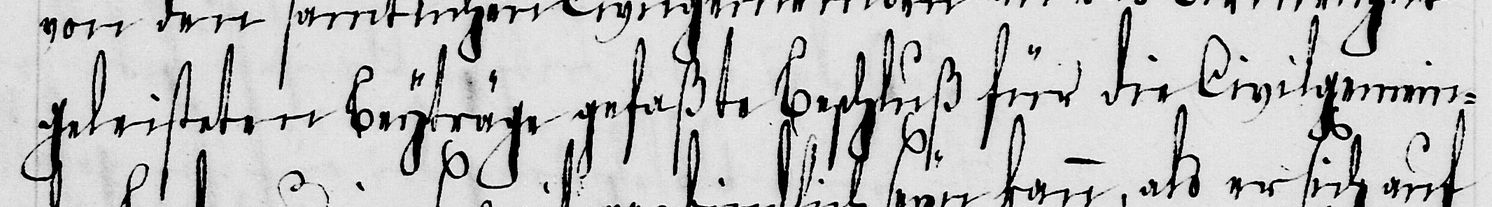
eleisteten Beyträge gefaßte Beschluß für die Civilgeme¬
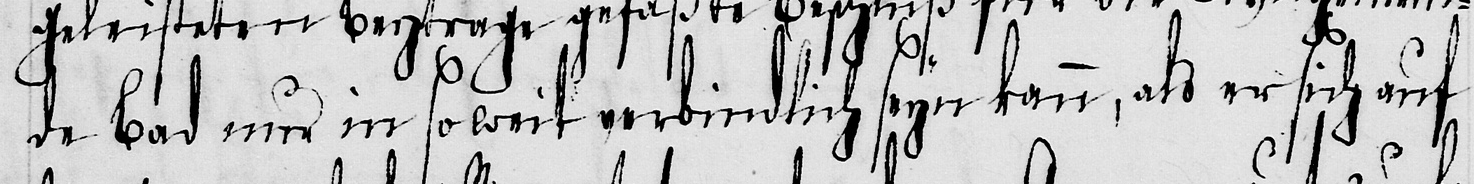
de Bad nur in so weit verbindlich seyn kann, als er sich auf
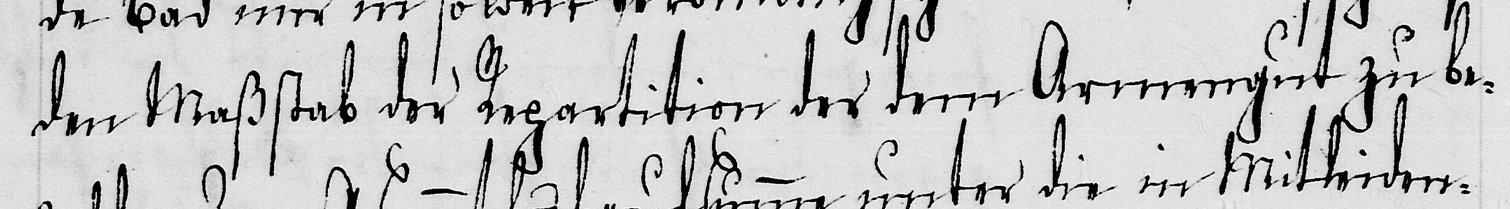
den Maßstab der Repartition der dem Armengut zu be¬
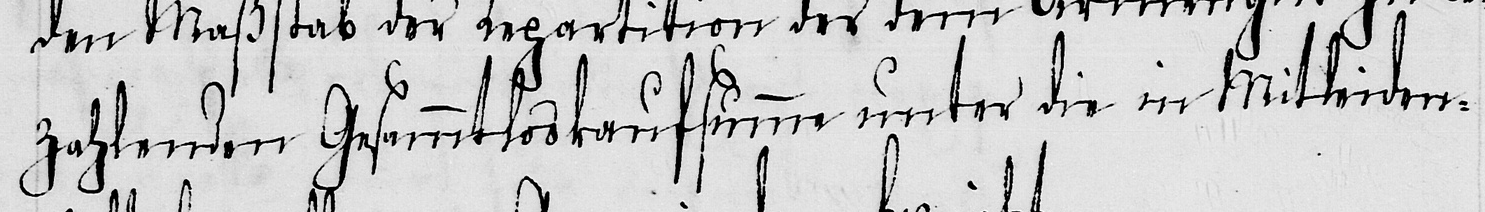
zahlenden Gesammtloskaufsumme unter die in Mitleiden¬
